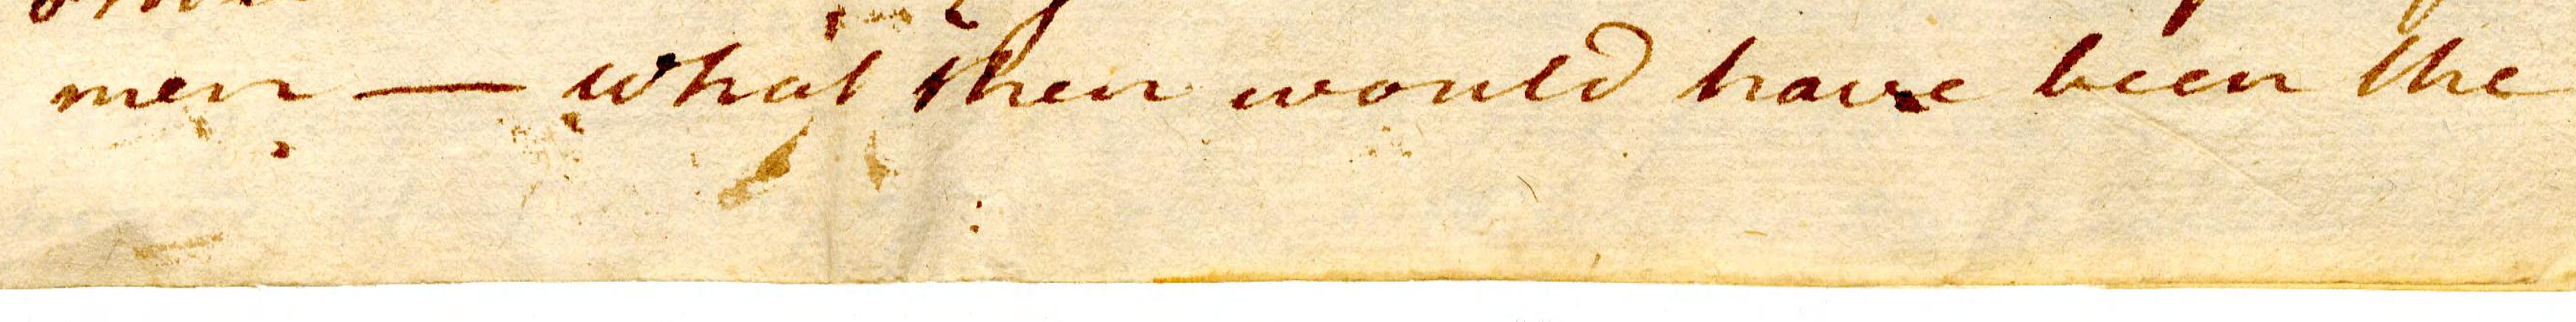men- What then would have been the
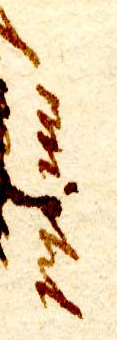might
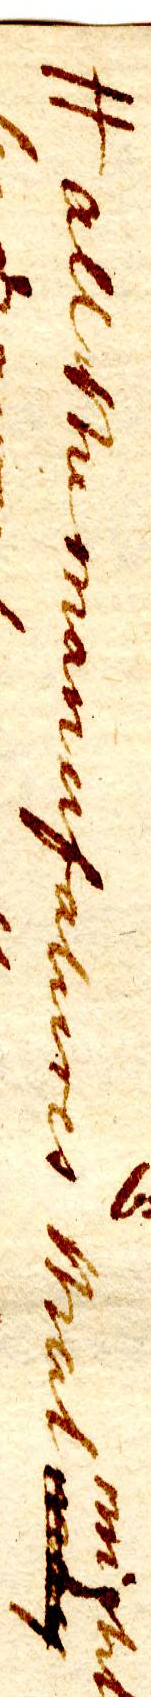tt all the manufactures that [may]
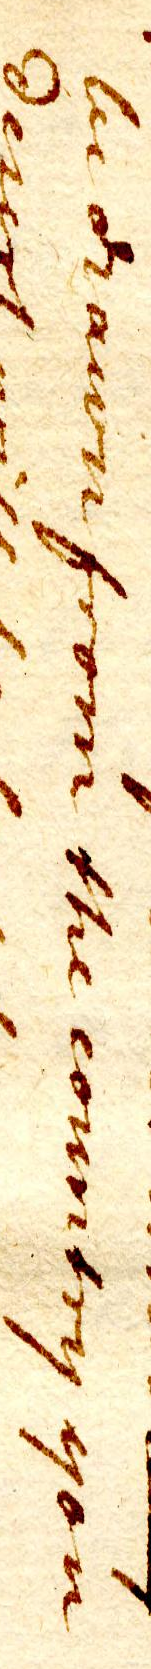be drawn from the country you
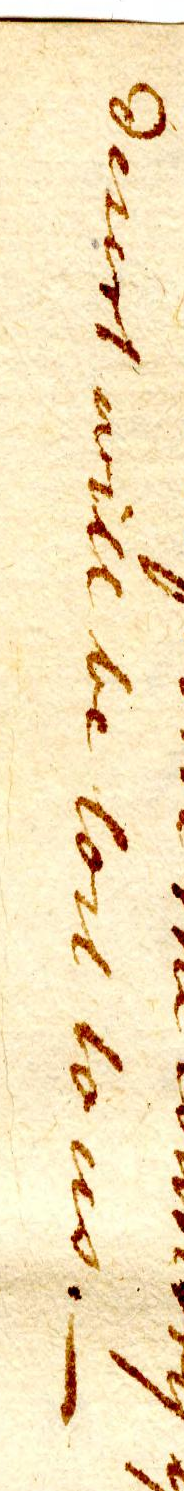desert will be lost to us.-
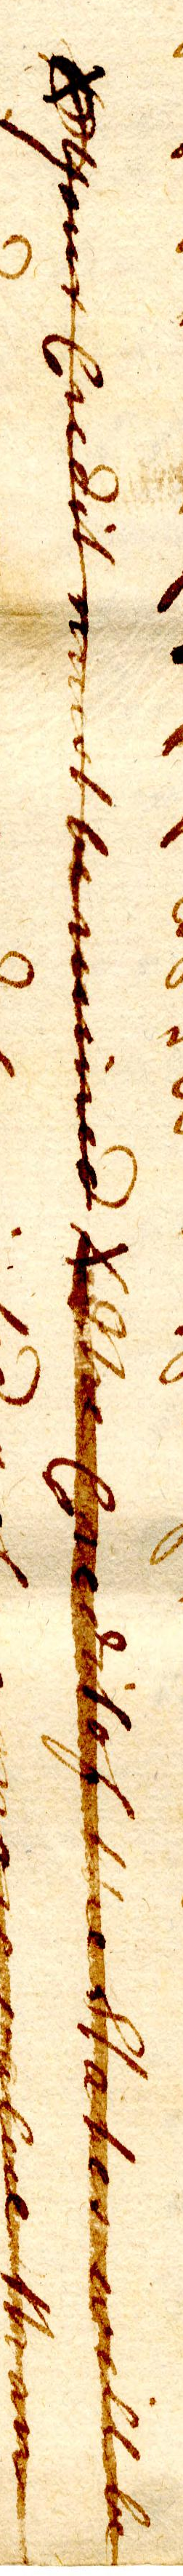[ X Your credit must be received X the Credit of the States will be]
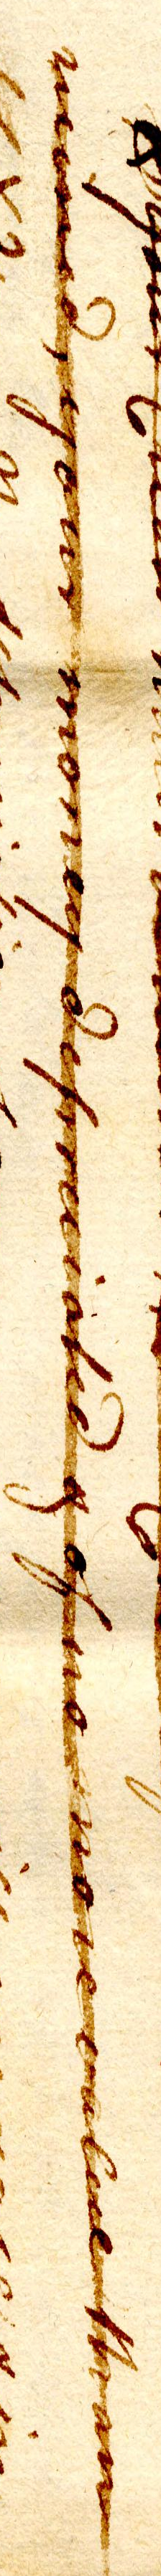[ruined, your money depreciated & of no more value than]
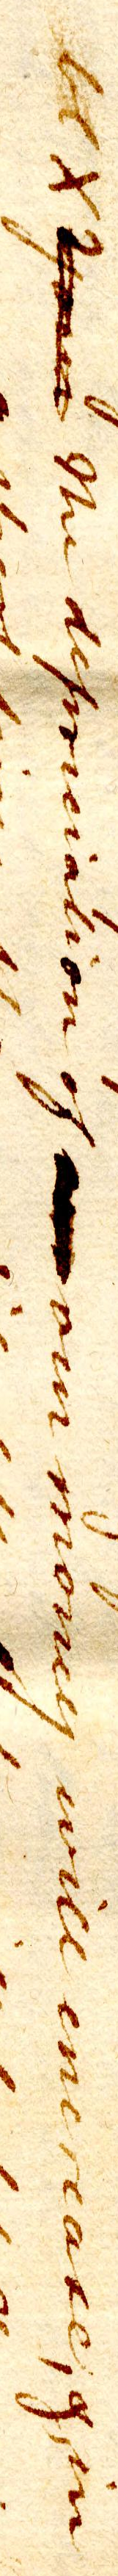be X [Your] the depreciation of [___] our money will encrease, &, in
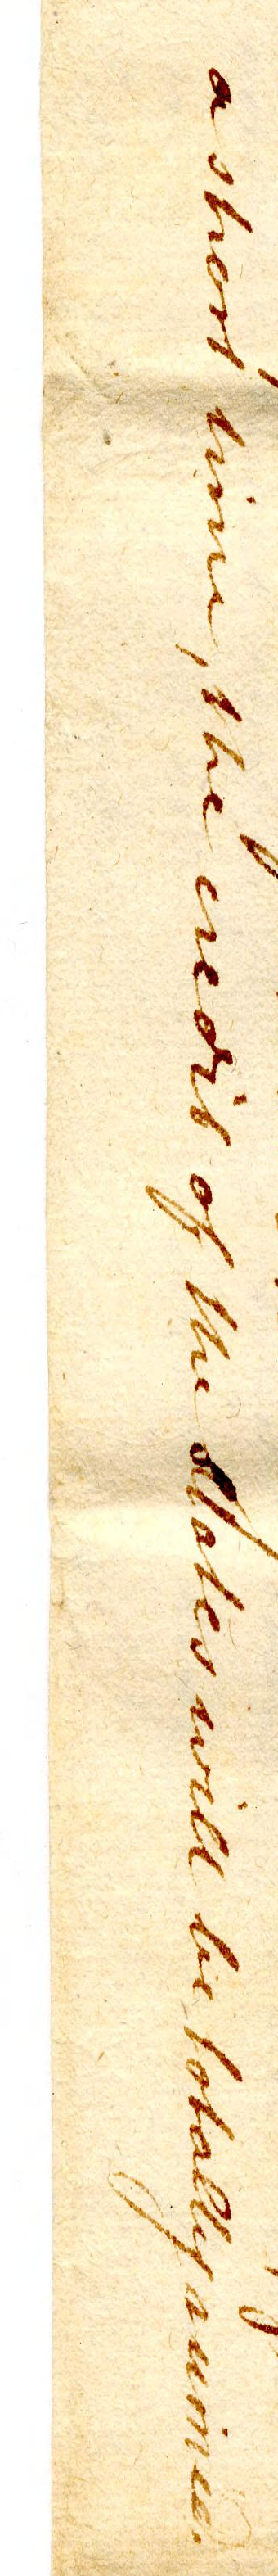a short time, the credit of the States will be totally ruined.
